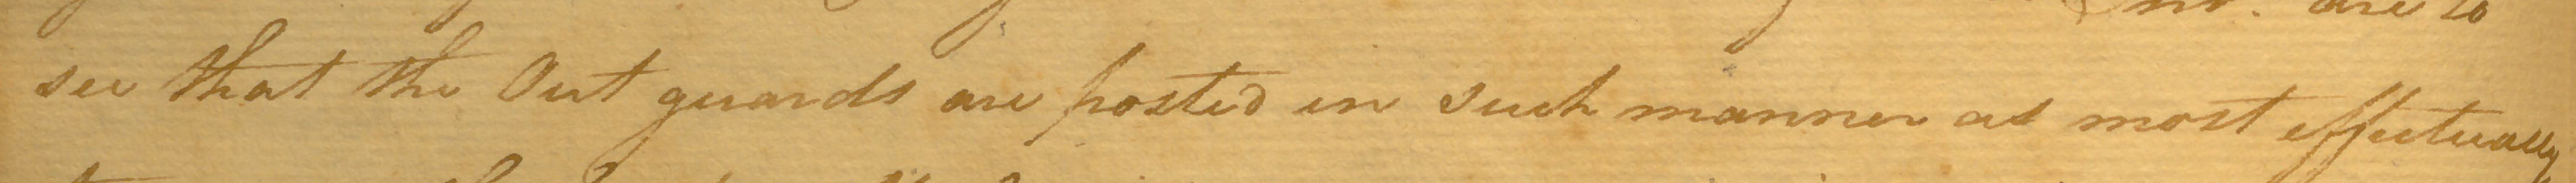see that the OUt guards are posted in such manner as most effectually
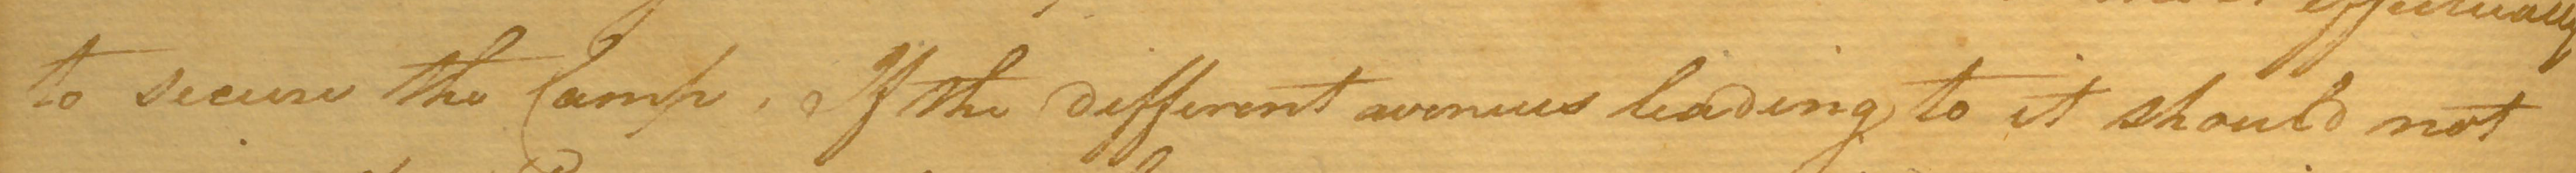to secure the Camp. If the different avenues leading to it should not
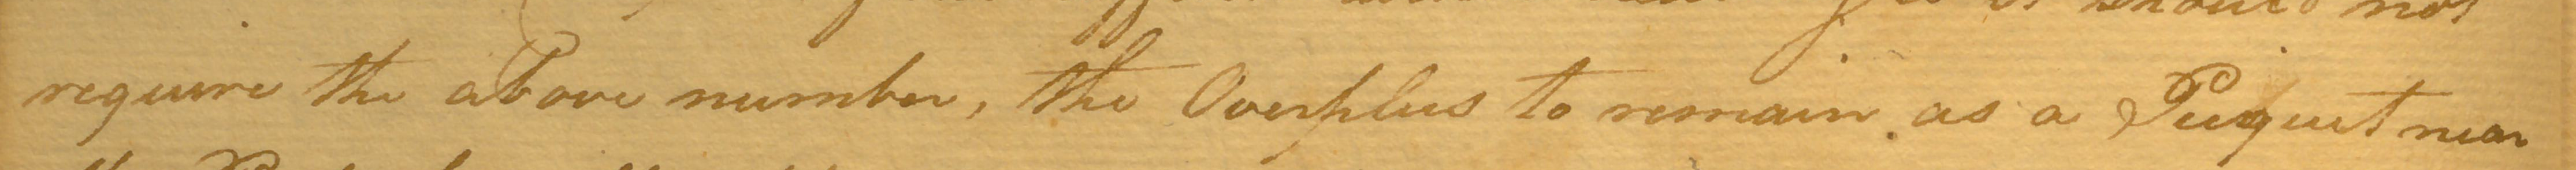require the above number, the Overplus to remain as a Picquet near
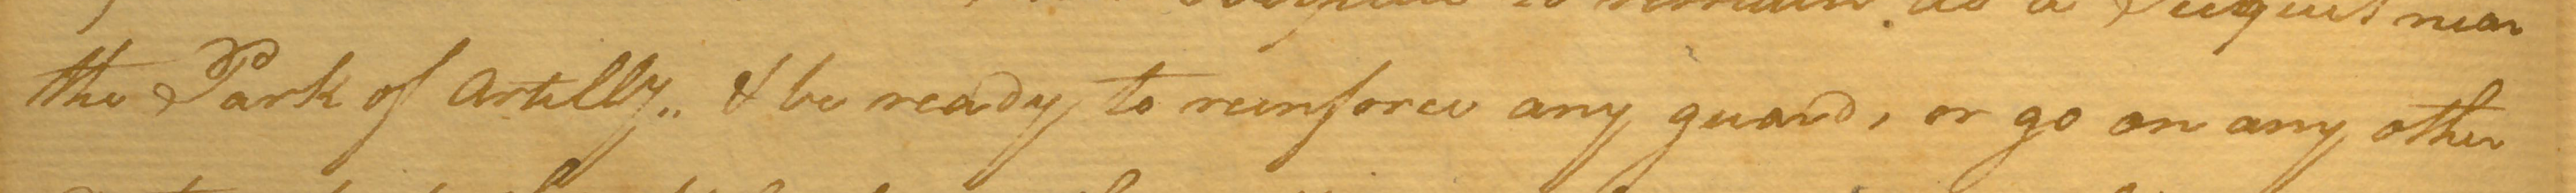the Park of Artill^y. & be ready to reinforce any guard, or go on any other
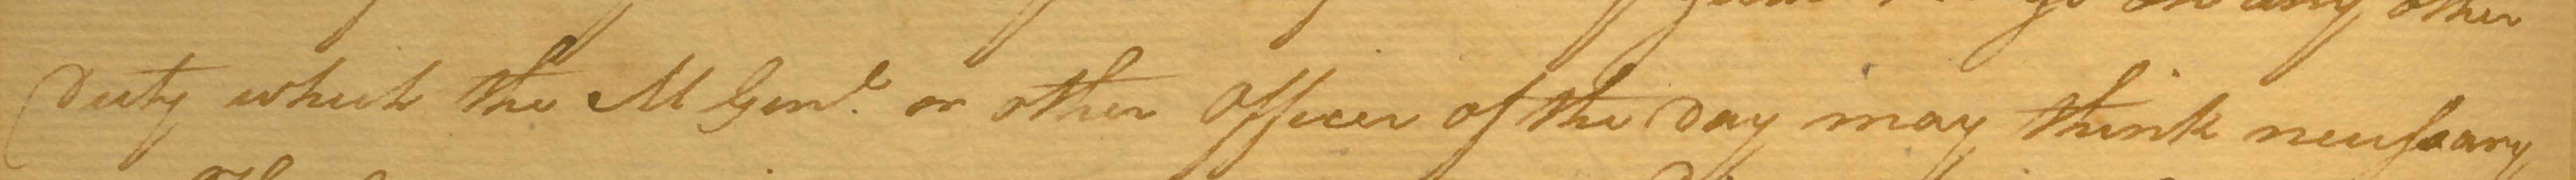duty which the M Gen^l. or other Officer of the day may think necessary
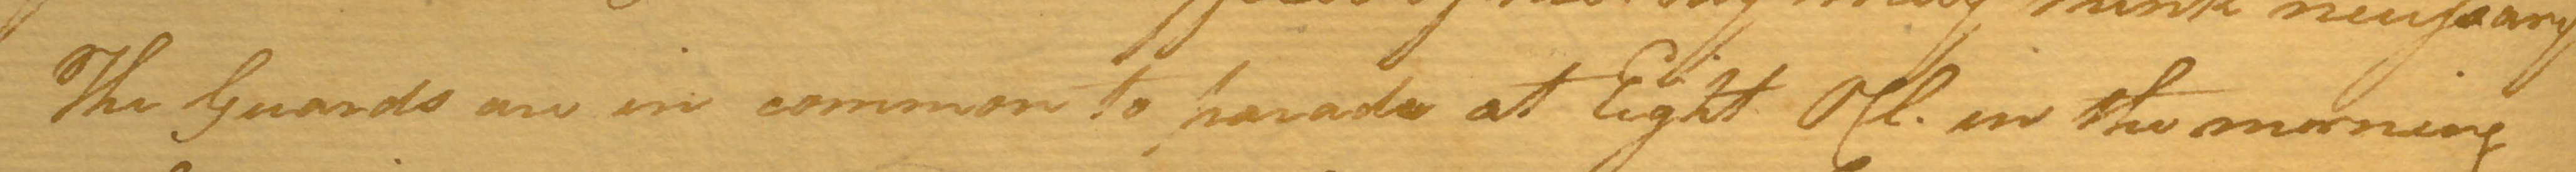The Guards are in common to parade at Eight oCl. in the morning
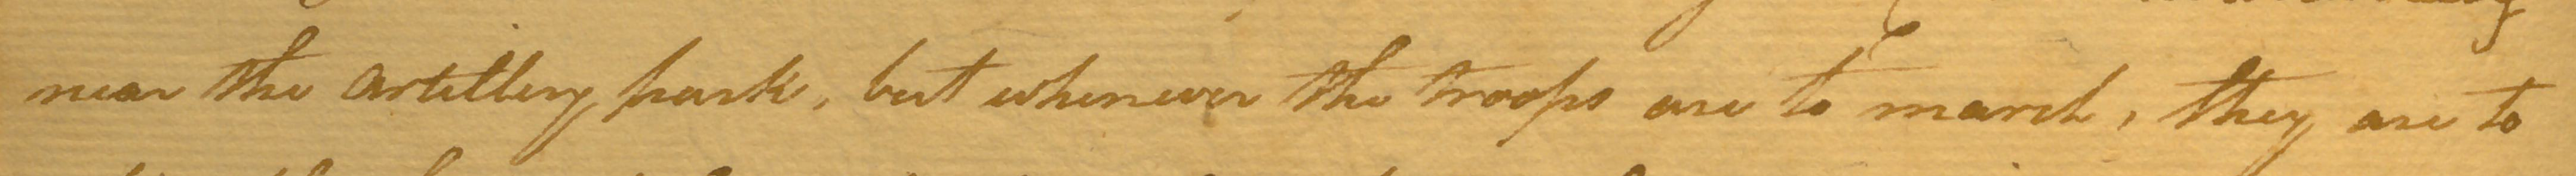near the Artillery park, but whenever the troops are to march, they are to
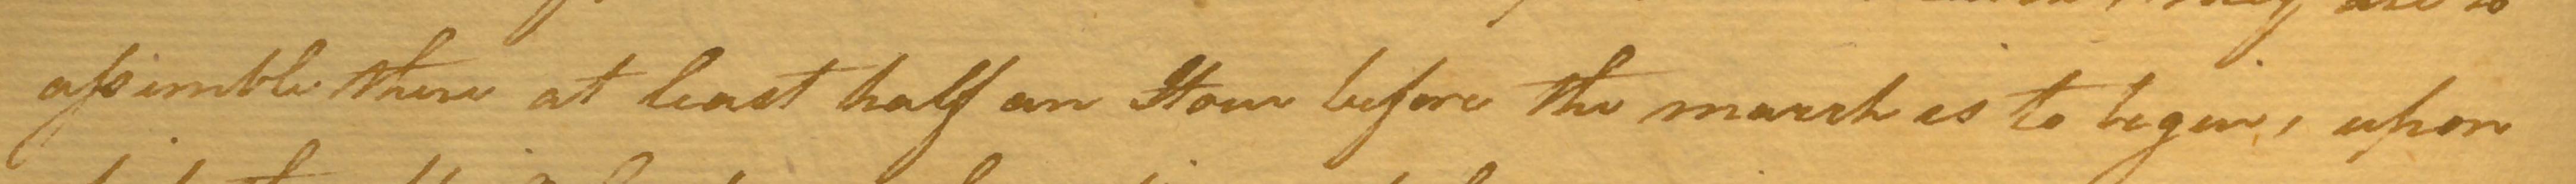assemble there at least half an Hour before the march is to begin, upon
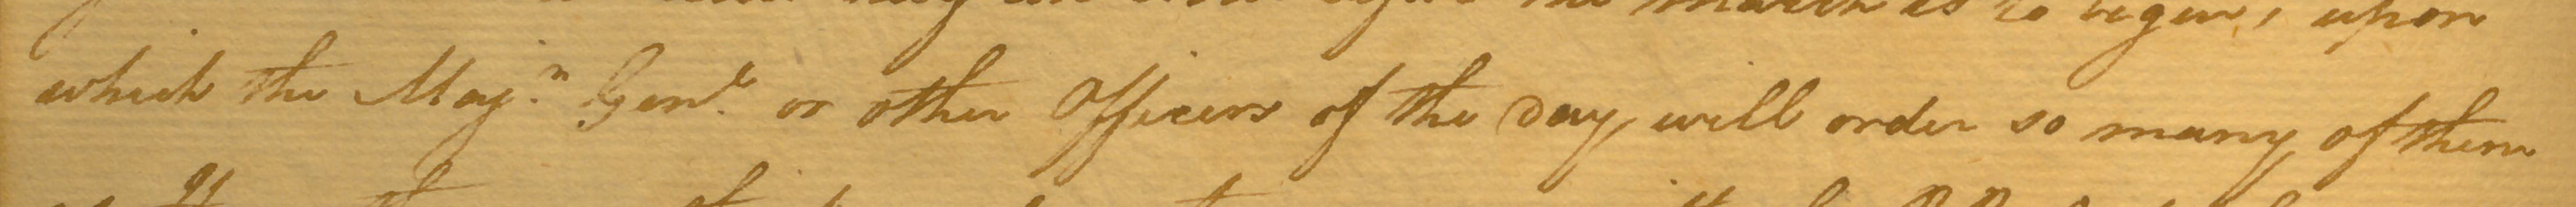which the Maj^r. Gen^l. or other Officers of the day will order so many of them
